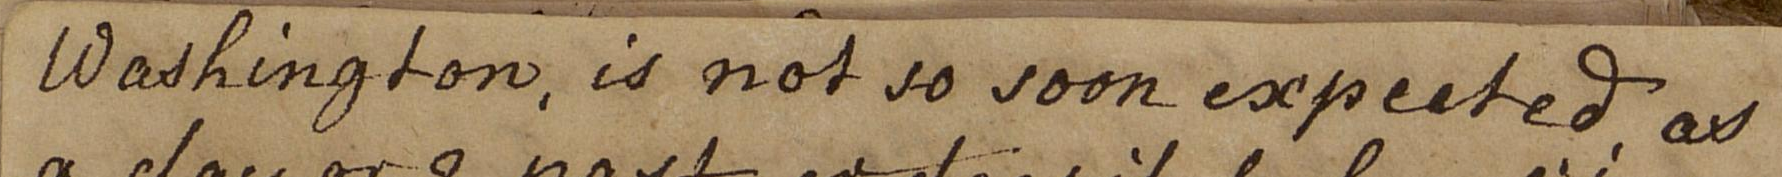Washington, is not so soon expected as
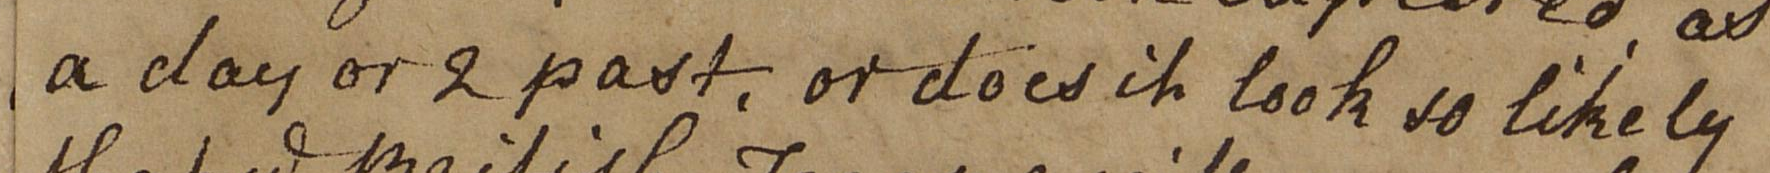a day or 2 past, or does it look so likely
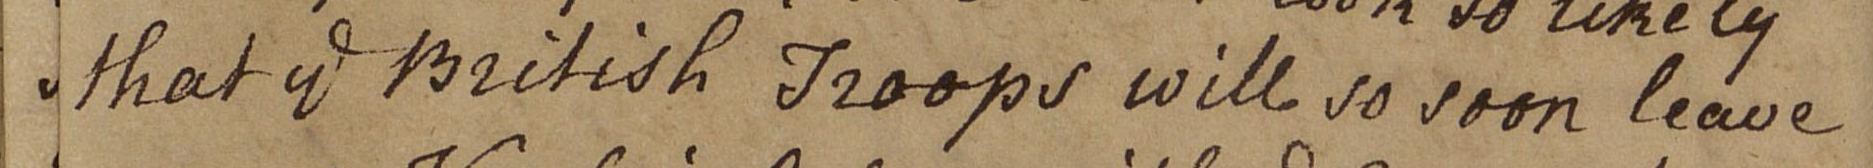that y^e British Troops will so soon leave
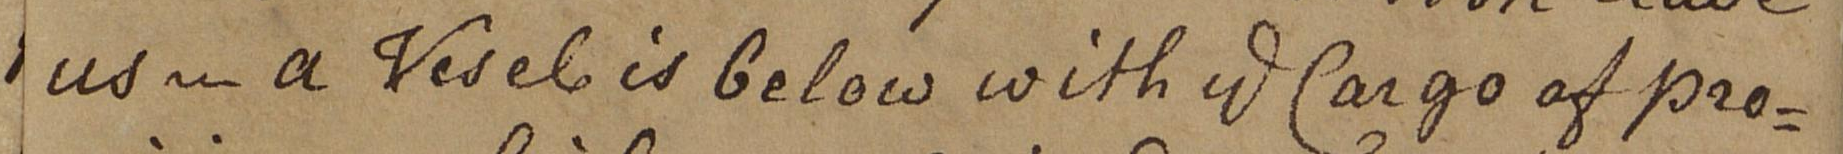us- a Vesel is below with y^e Cargo of pro-
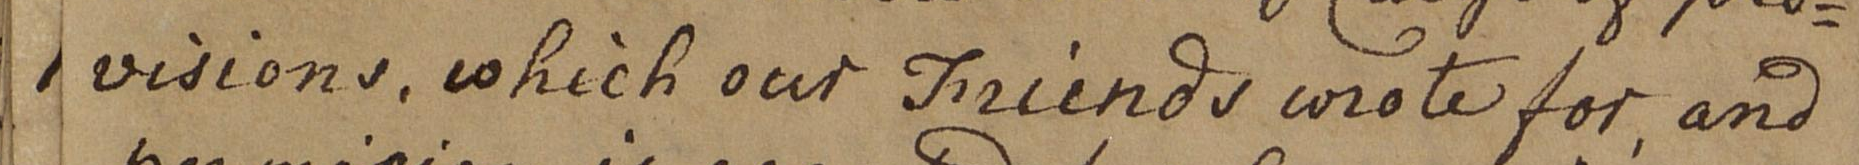visions, which our Friends wrote for, and
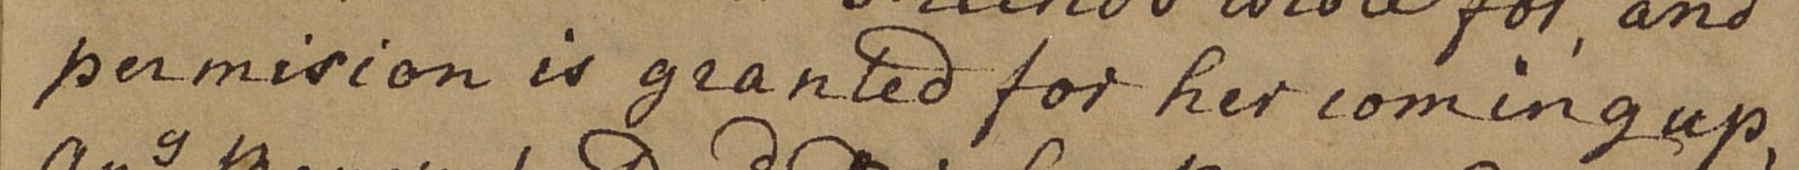permision is granted for her coming up,
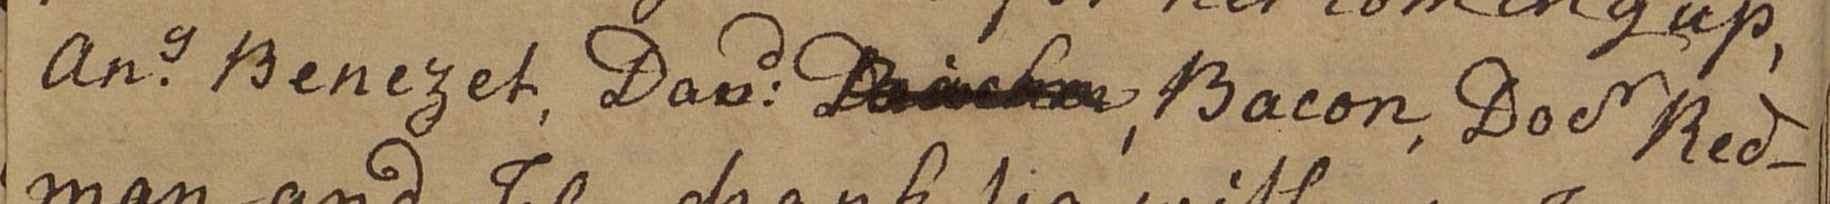An^y. Benezet, Dav^d: [Drinker], Bacon, Doc^r Red-
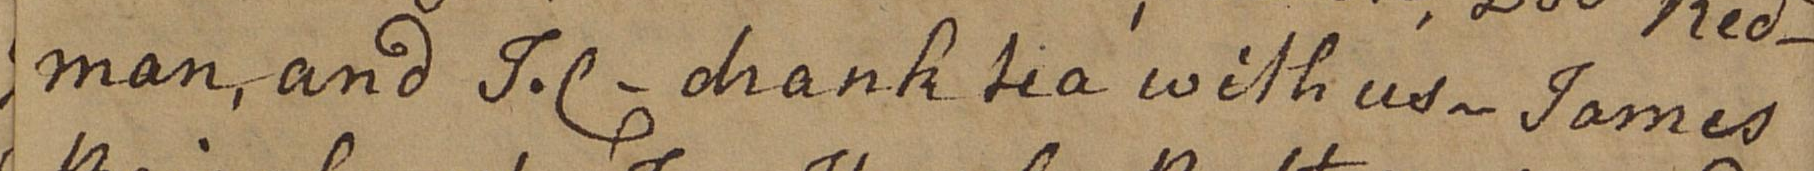man, and J.C- drank tea with us- James
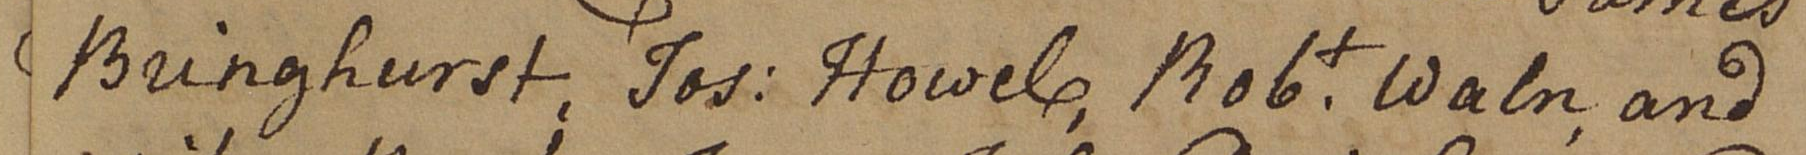Bringhurst, Jos: Howel, Rob^t. Waln, and
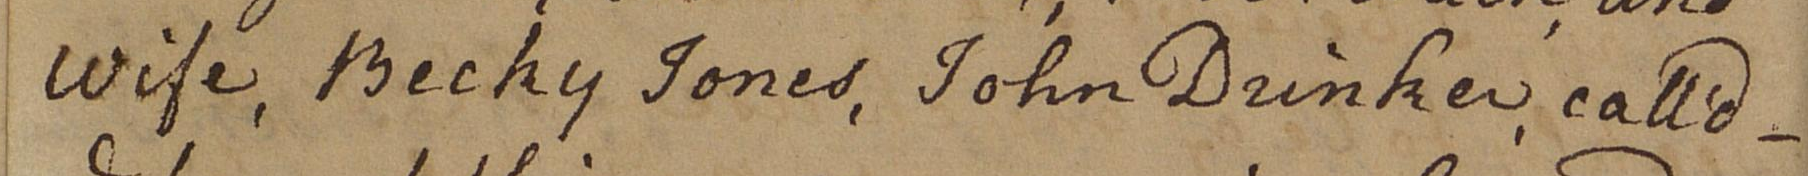Wife, Becky Jones, John Drinker, call'd-
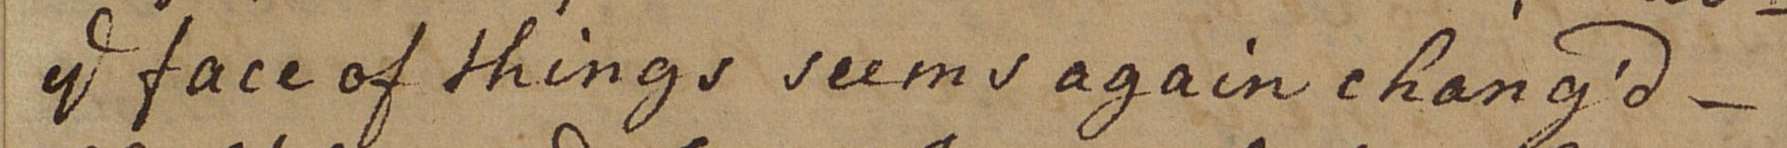y^e face of things seems again chang'd-
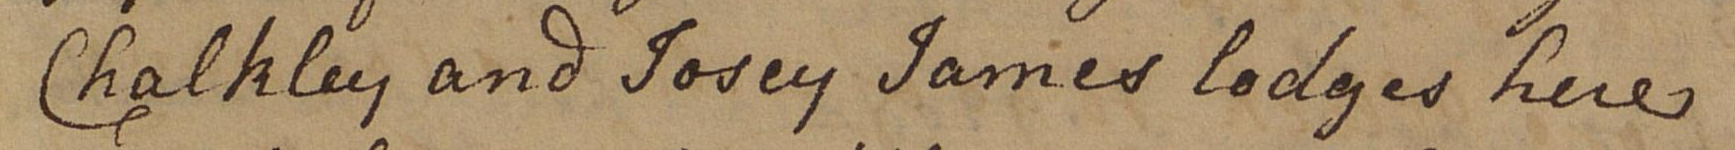Chalkley and Josey James lodges here
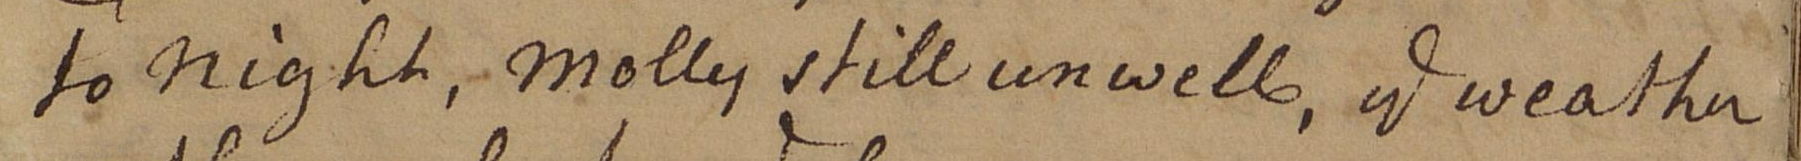to Night, Molly still unwell, y^e weather
